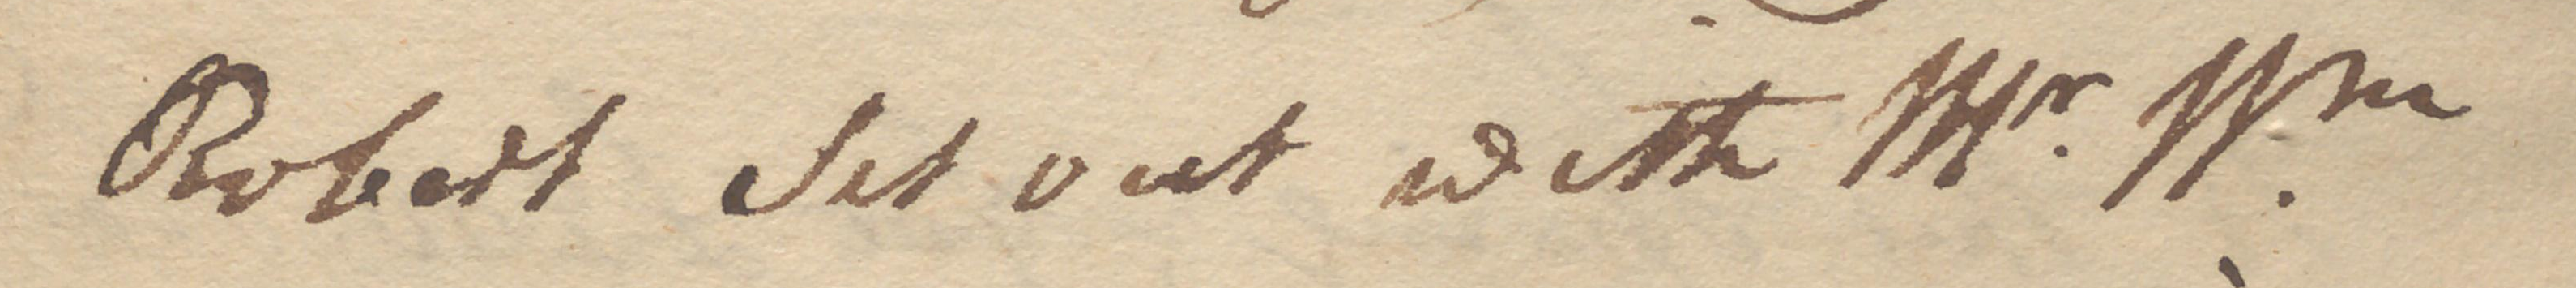Robert set out with M^r. W^m.
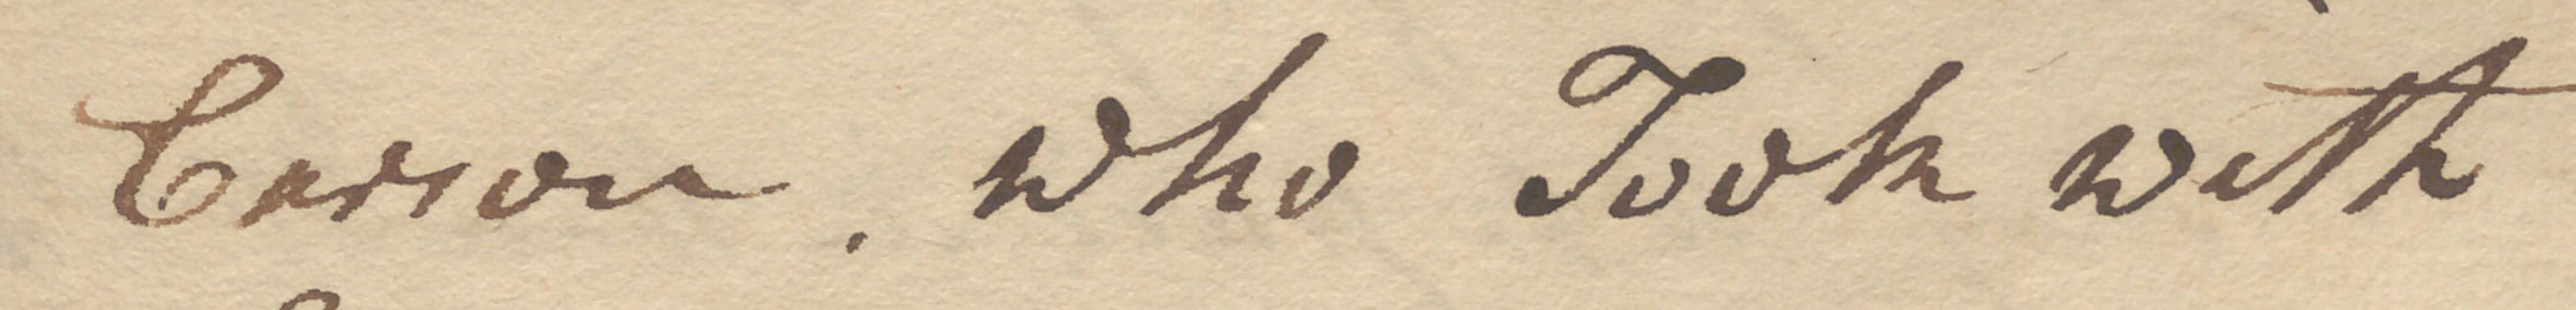Carson who Took with
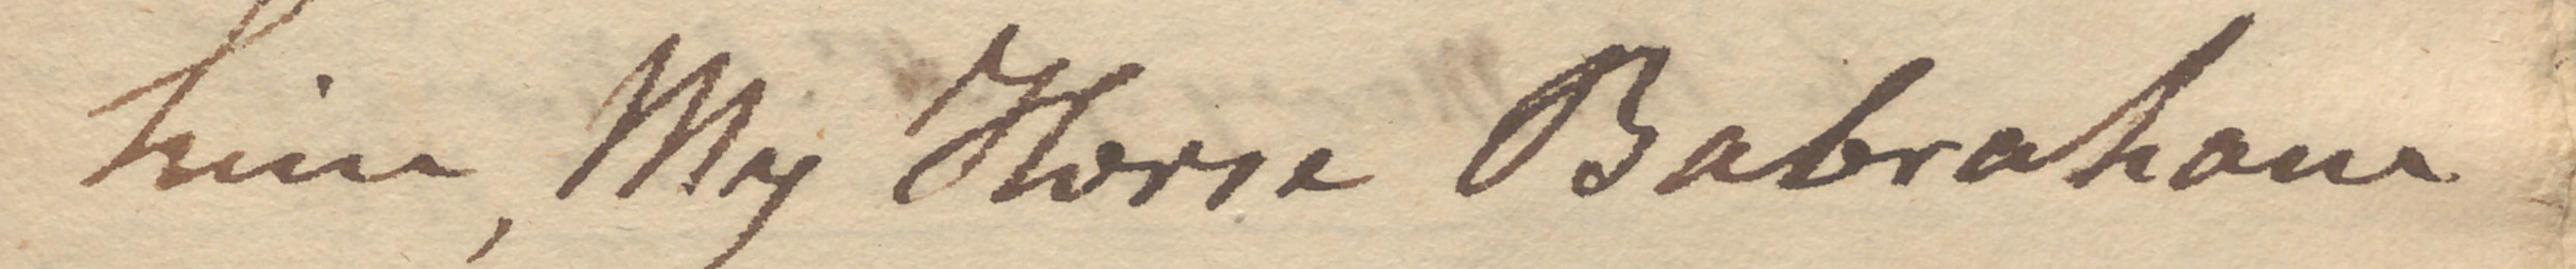hine My Horse Babraham
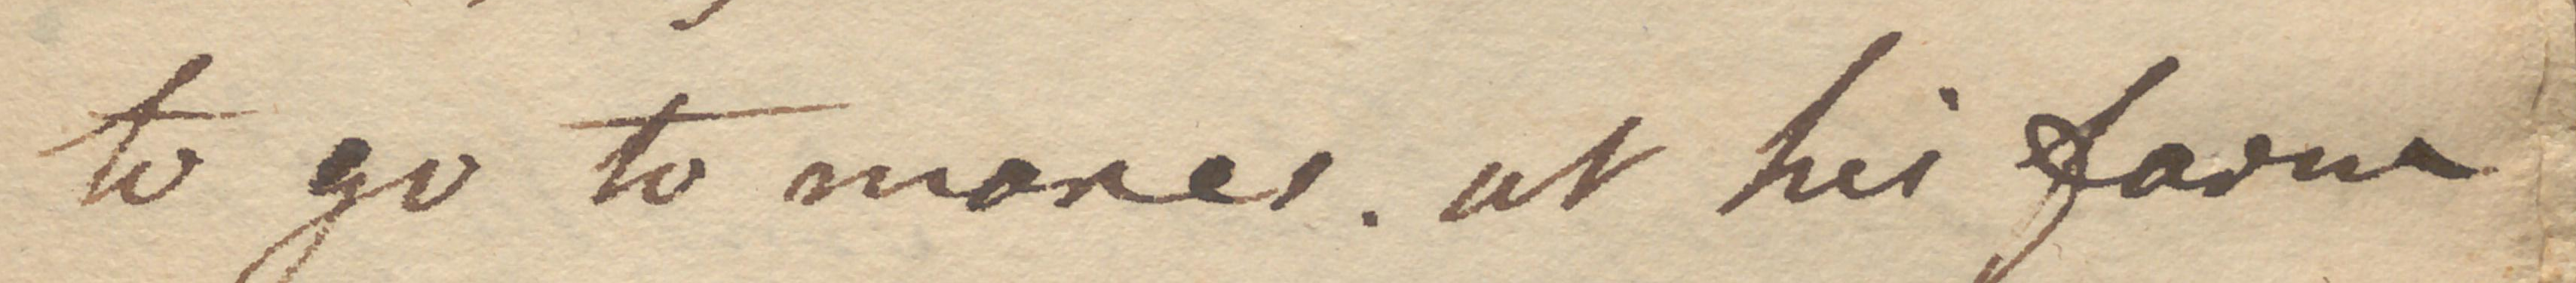to go to mares at his farm
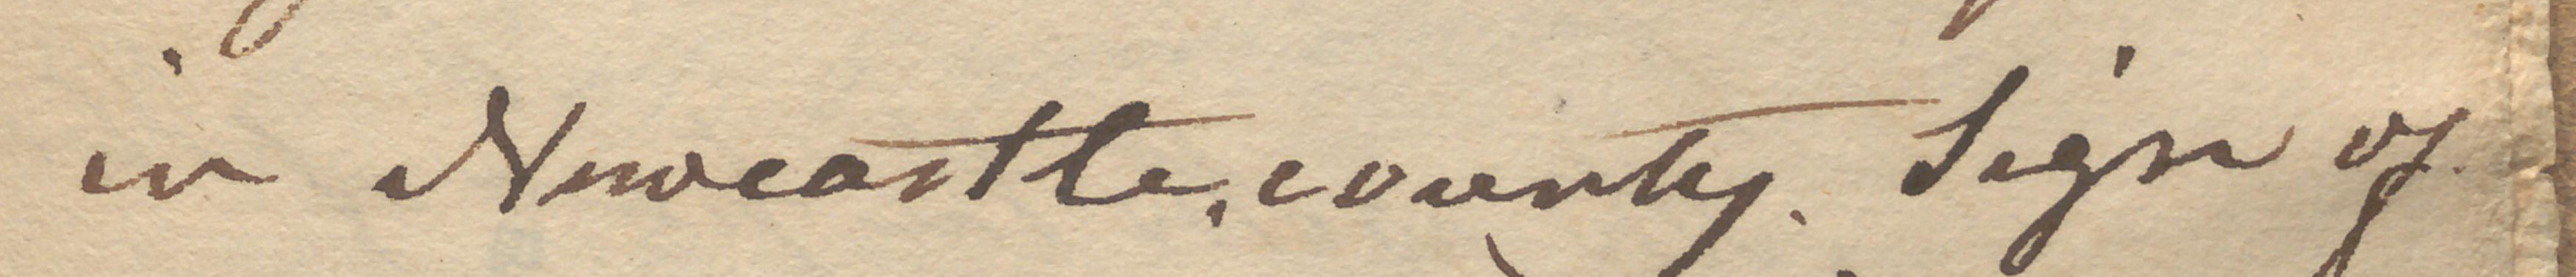in Newcastle county Sign of
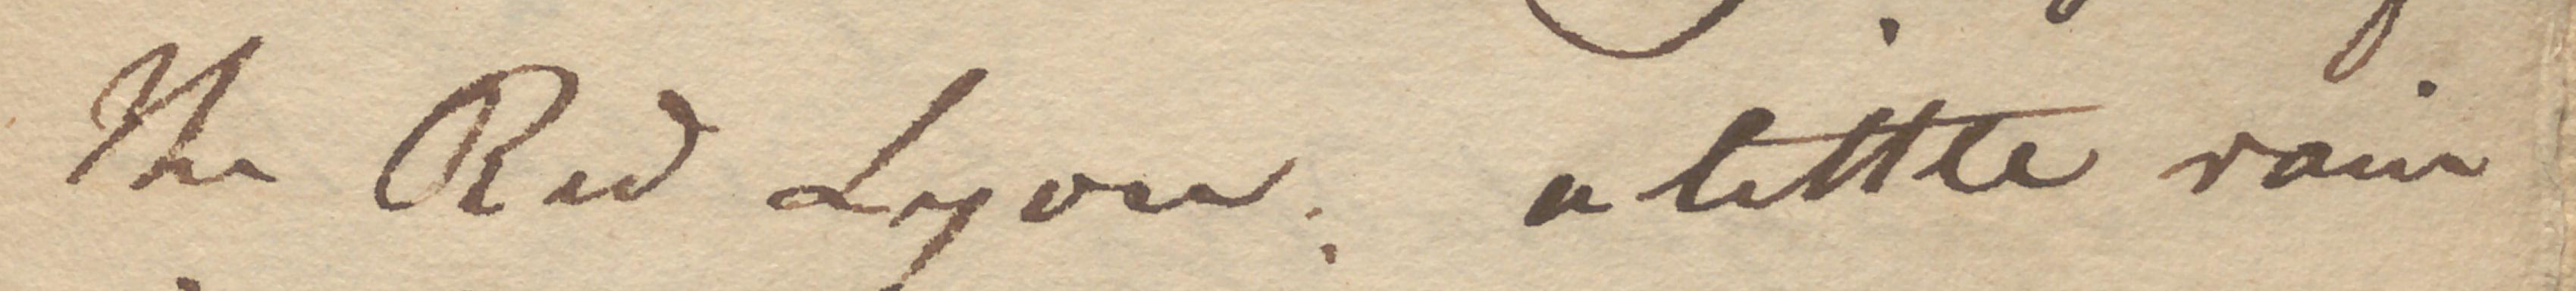the Red Lyon. a little rain
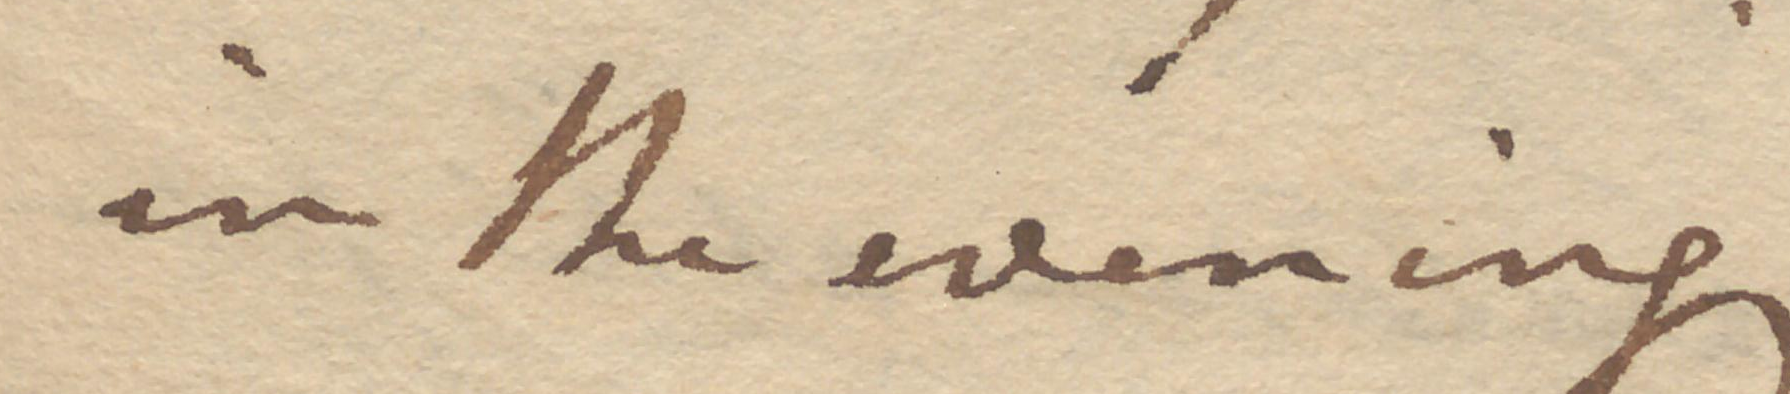in the evening
